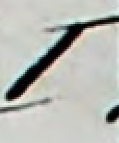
I
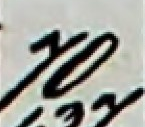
70
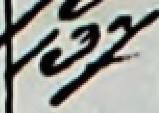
137
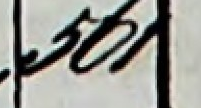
561
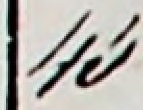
45
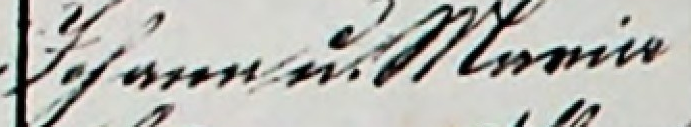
Johann u. Maria
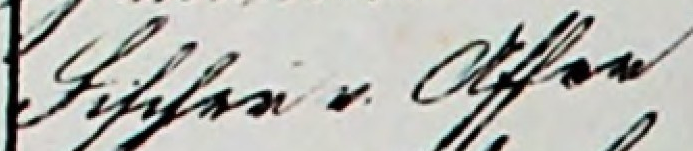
Fischer v. Affer
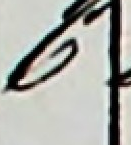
6
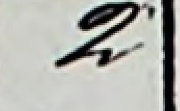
2
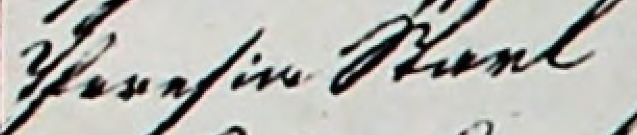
Theresine Starl
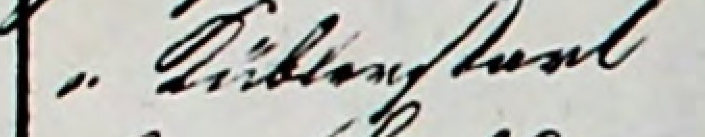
v. Küblerstarl
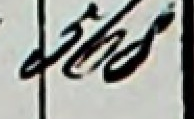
568
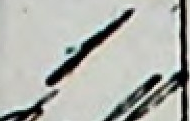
1
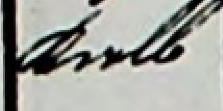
Kalb
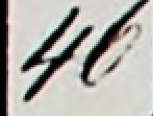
46
